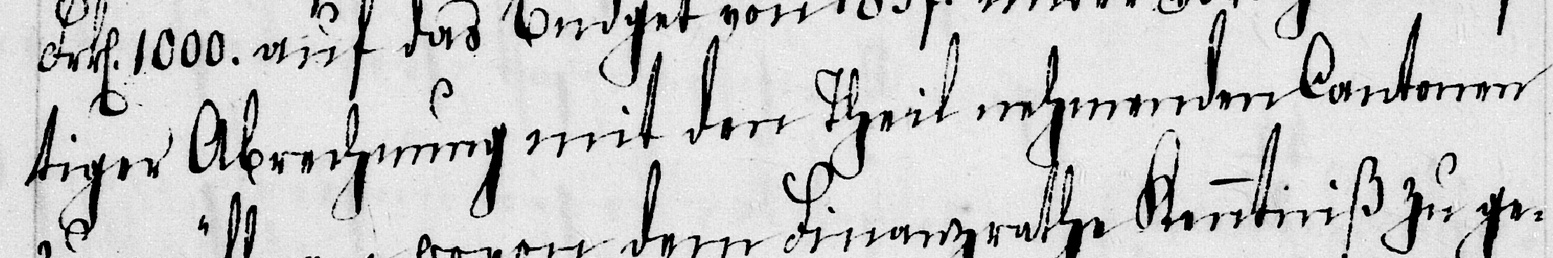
tiger Abrechnung mit den Theil nehmenden Cantonen
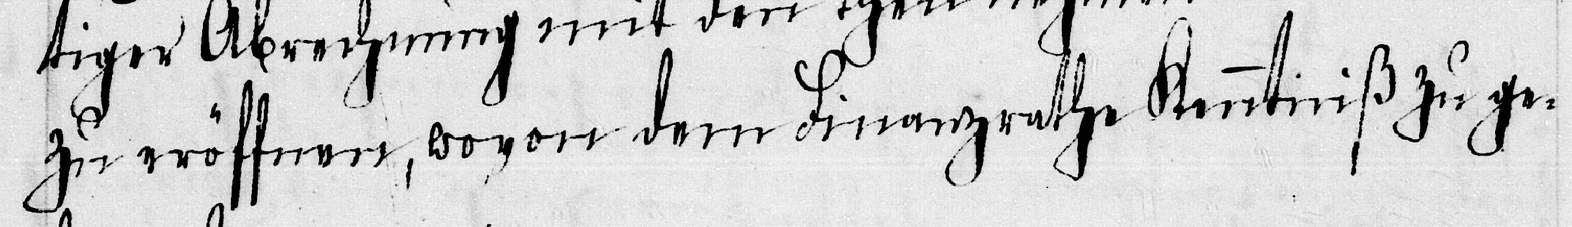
zu eröffnen, wovon dem Finanzrathe Kenntniß zu ge¬
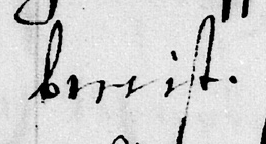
ben ist.
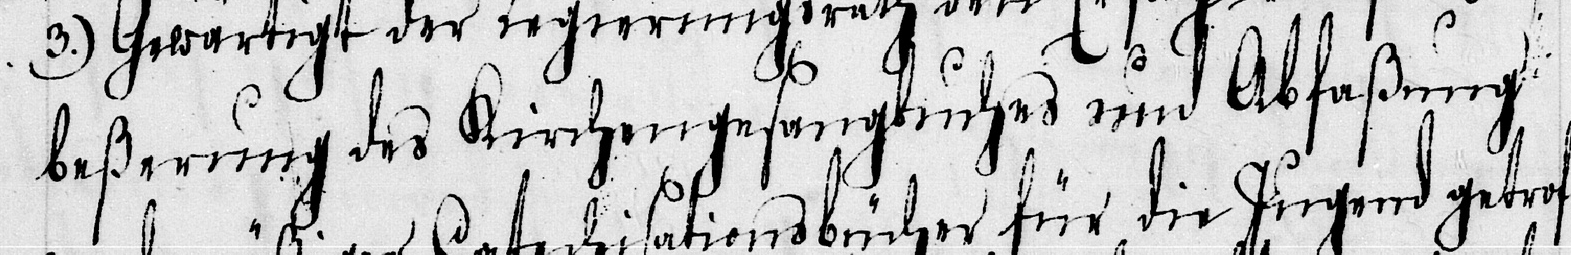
beßerung des Kirchengesangsbuches und Abfaßung
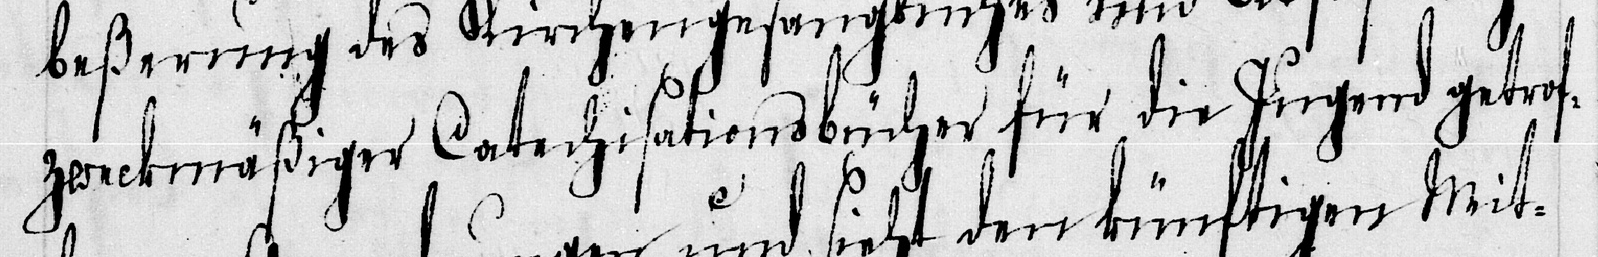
zweckmäßiger Catechisationsbücher für die Jugend getrof¬
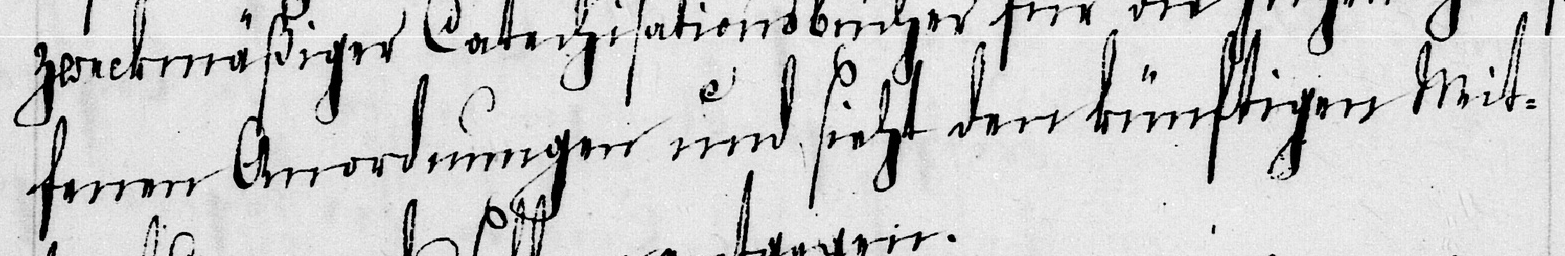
fenen Anordnungen und sieht den künftigen Mit¬
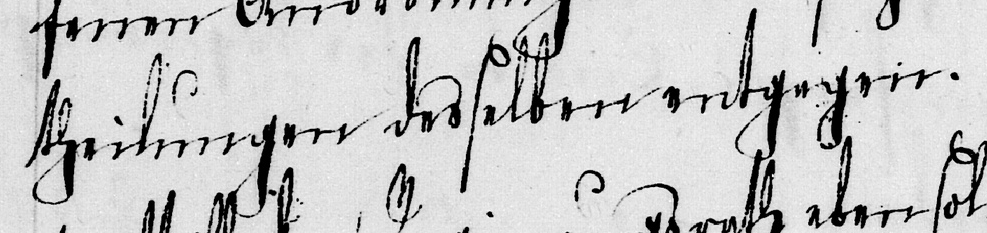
theilungen desselben entgegen.
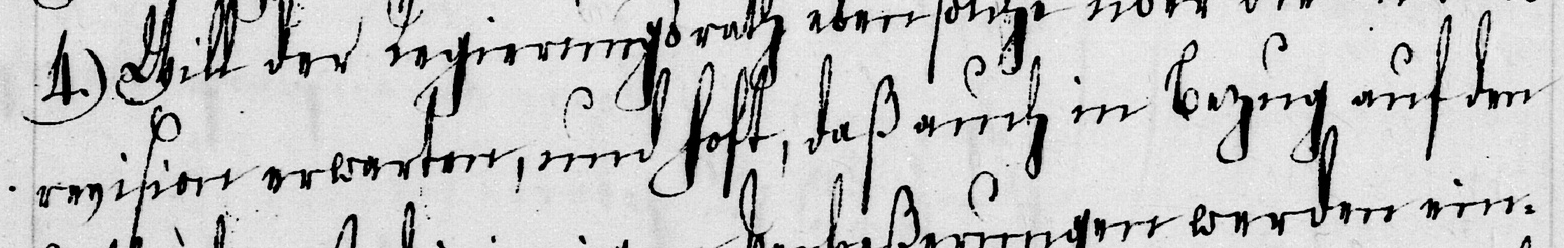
revision erwarten, und hoft, daß auch in Bezug auf den
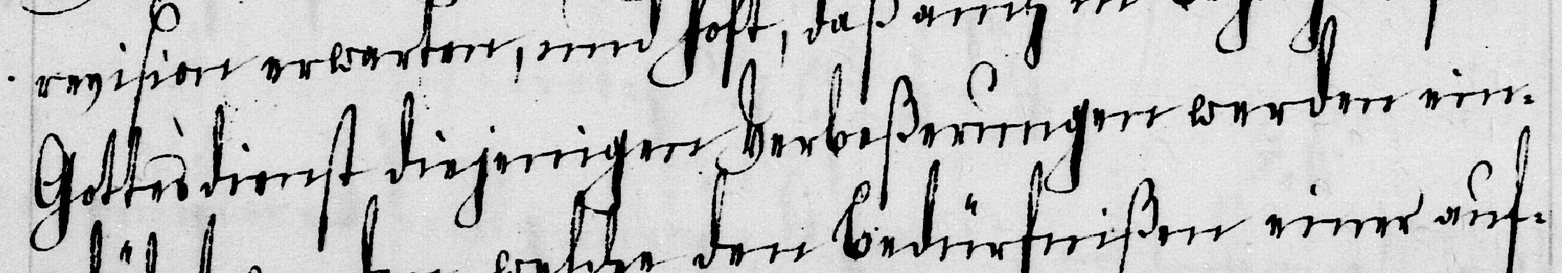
Gottesdienst diejenigen Verbeßerungen werden ein¬
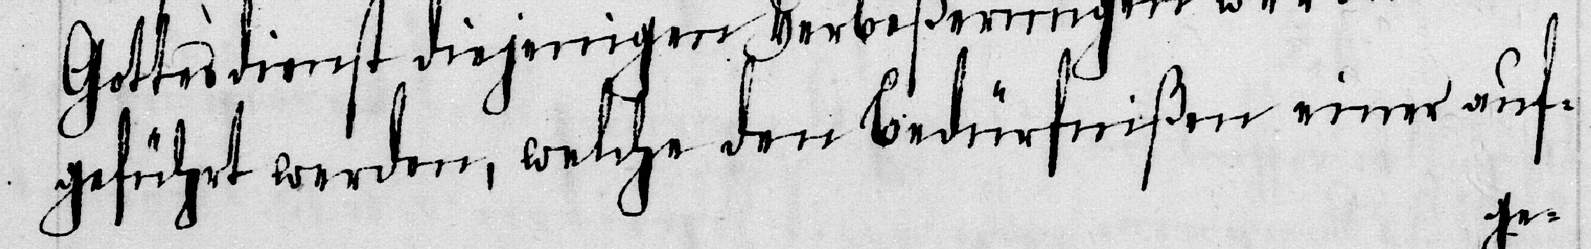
geführt werden, welche den Bedürfnißen einer auf-
